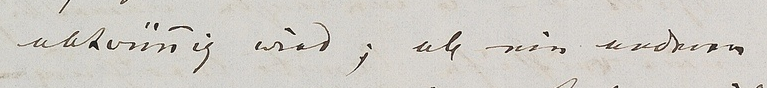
abtrünnig wird; ob ein anderer
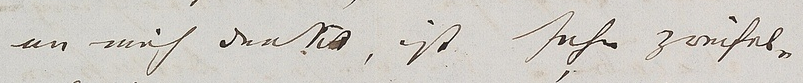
an mich denkt, ist sehr zweifel-
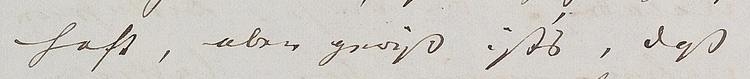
haft, aber gewiss ist's, daß
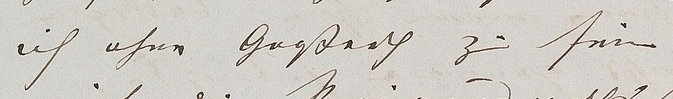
ich ohne Grossrath zu sein
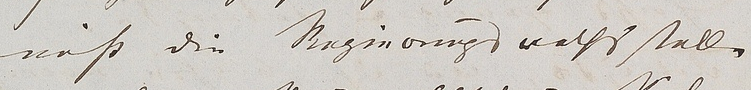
nicht die Regierungsrathsstelle
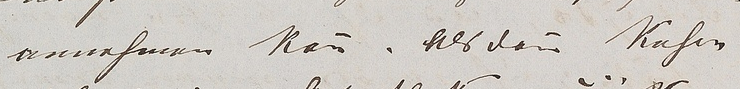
annehmen kann. Alsdann kehre
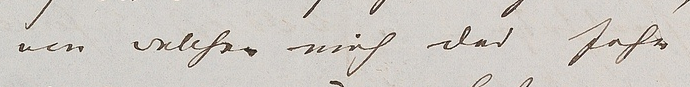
von welcher mich das Jahr
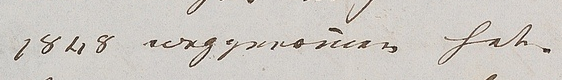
1848 weggenommen hat.
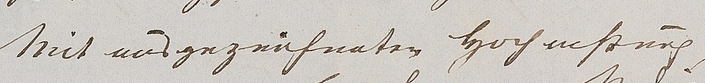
Mit ausgezeichneter Hochachtung,
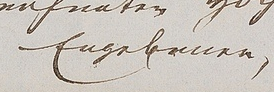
Ergebener,
